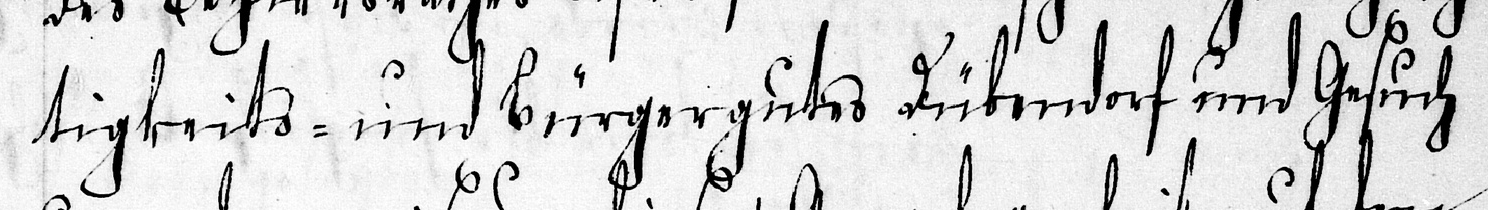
tigkeits- und Bürgergutes Dübendorf und Gesuch
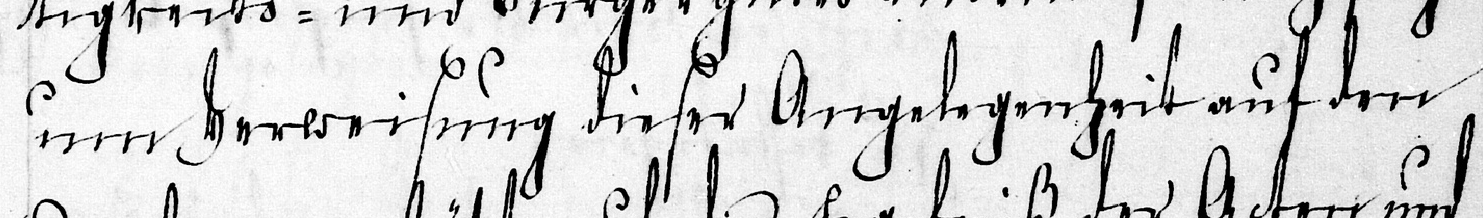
um Verweisung dieser Angelegenheit auf den
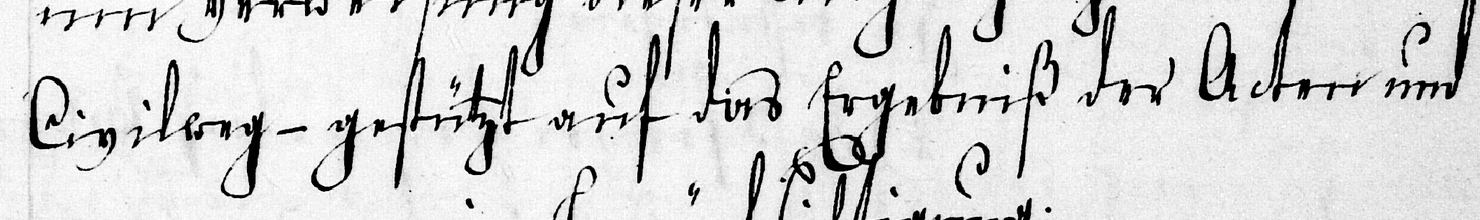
Civilweg – gestützt auf das Ergebniß der Acten und
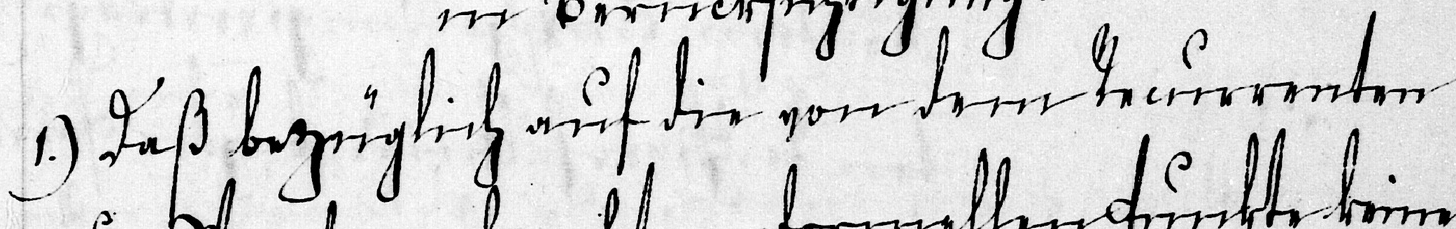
1.) Daß bezüglich auf die von dem Recurrenten
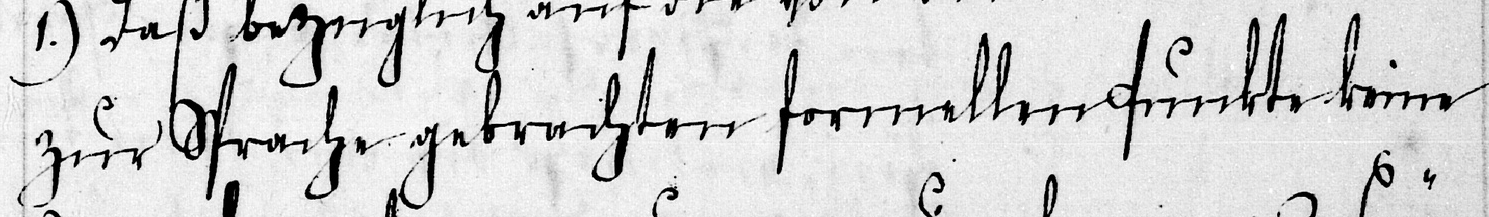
zur Sprache gebrachten formellen Punkte keine
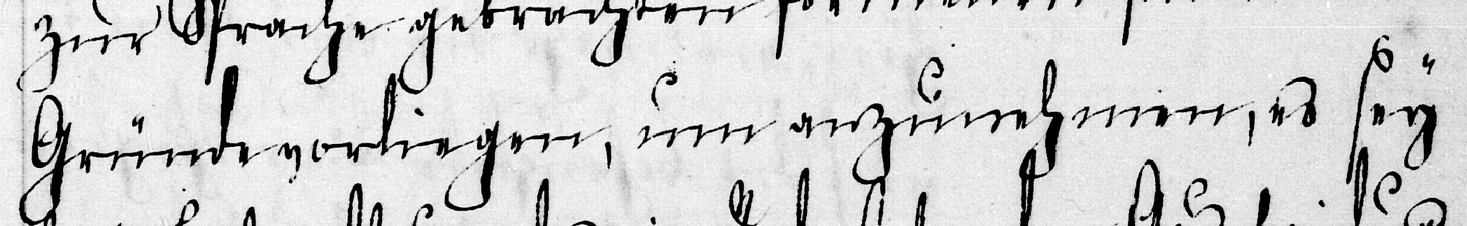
Gründe vorliegen, um anzunehmen, es sey
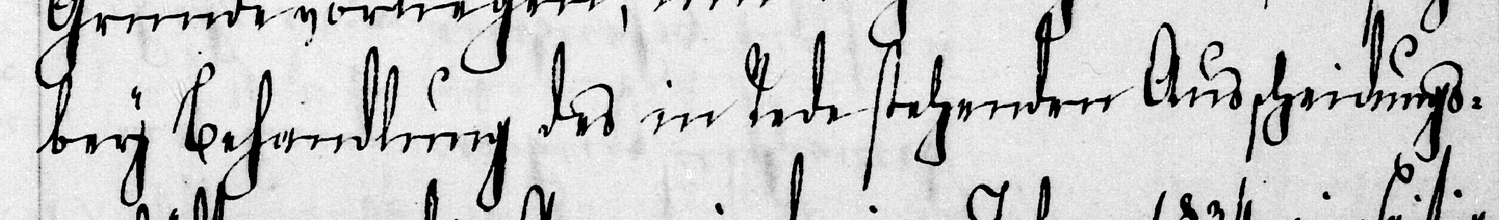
bey Behandlung des in Rede stehenden Ausscheidungs¬
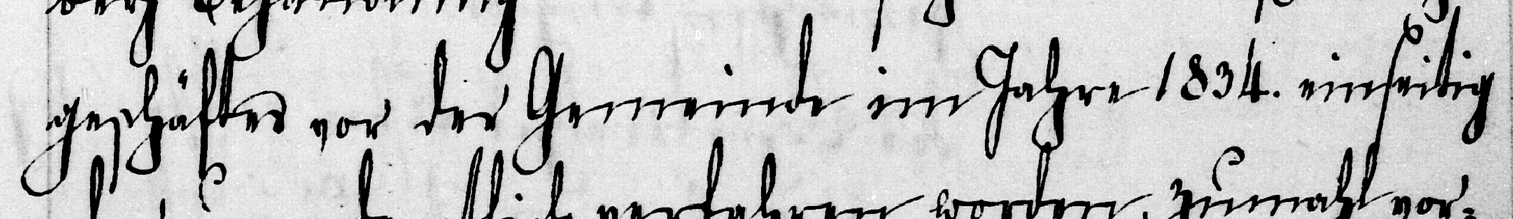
geschäftes vor der Gemeinde im Jahre 1834. einseitig
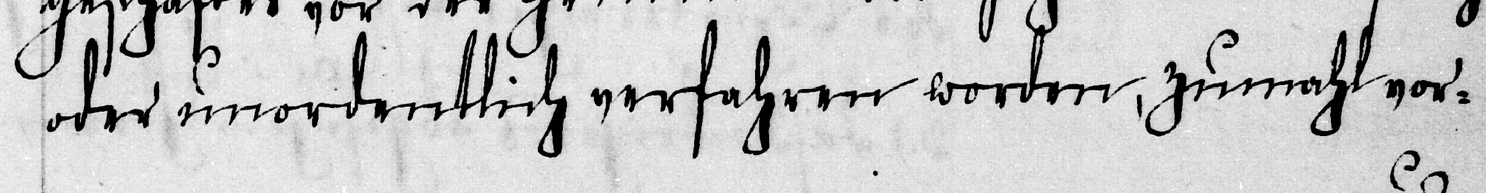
oder unordentlich verfahren worden, zumahl vor-
